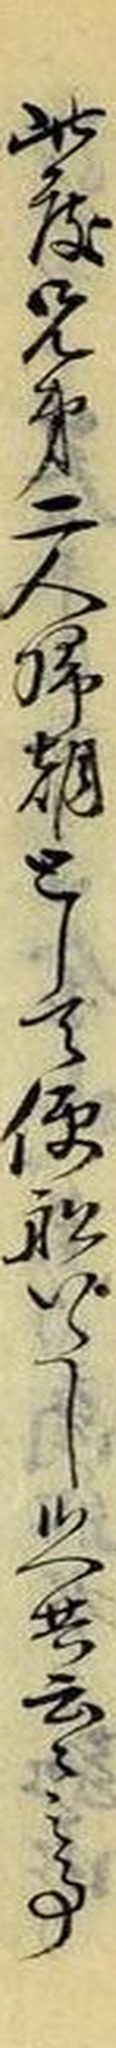此度兄弟二人帰朝として便船いたし候へ共云と之事
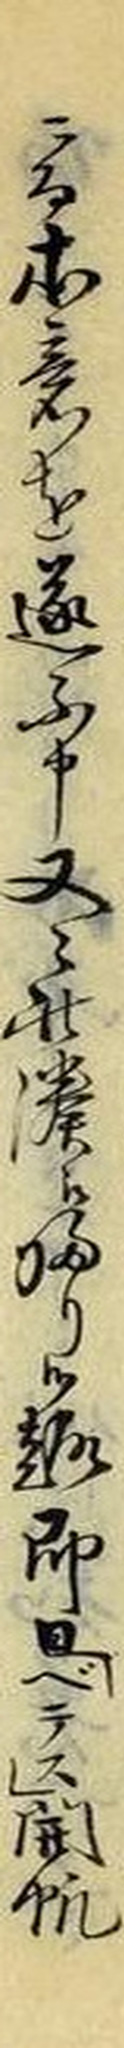ニ而本意遂を遂不申又々此湊江帰り候趣即日「べテス」開帆
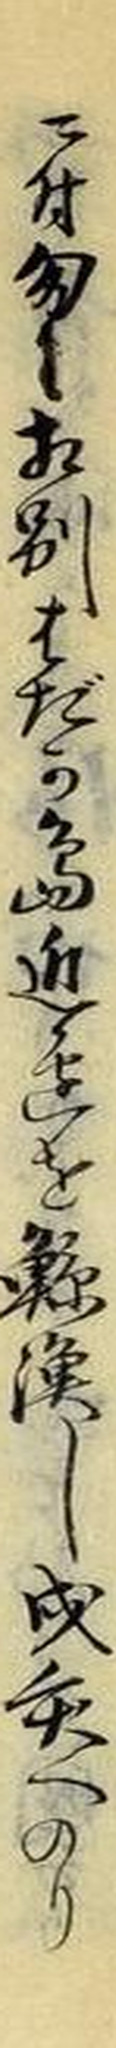ニ付匆く相別はだか島近辺を鯨漁し戌亥へのり
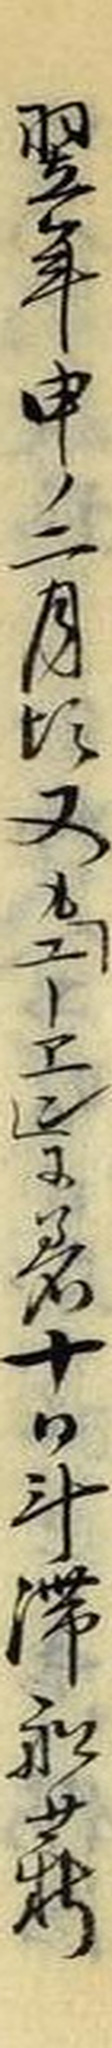翌年申ノ二月頃又も「ユーエン」に着十日計滞船薪
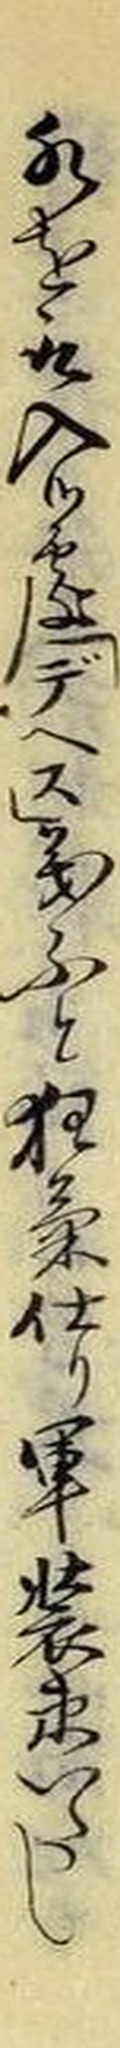水を取入候處「デへス」義ふと狂柔仕り軍装束いたし
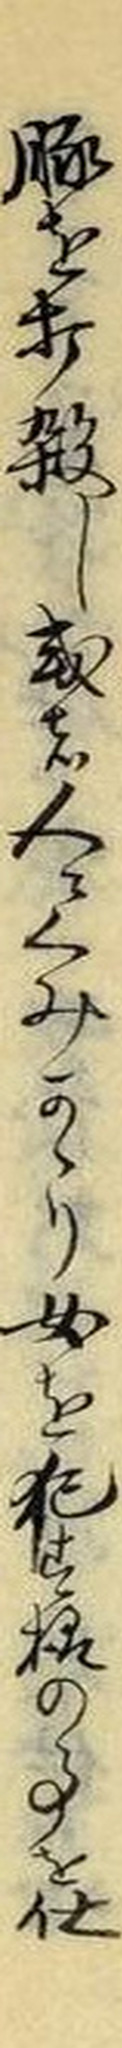豚を打殺し或は人二くみかゝり女を犯す様の事を仕
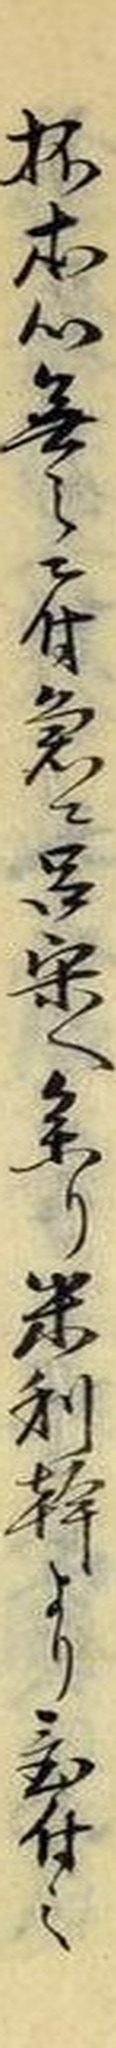抔本心無之ニ付急ニルソンへ参りメリカより置付之
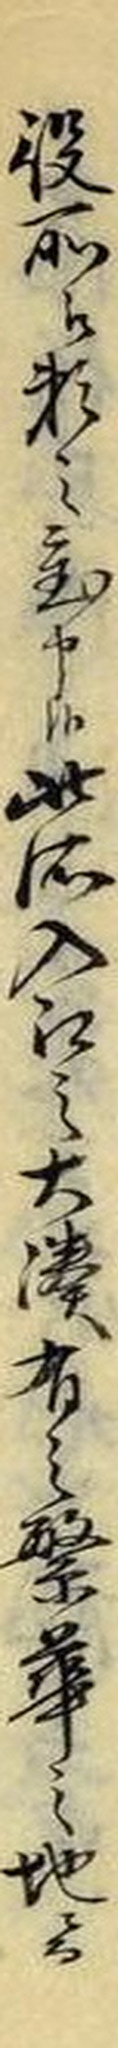役所江頼ミ置申候此所入江之大湊有之繁華之地ニ而
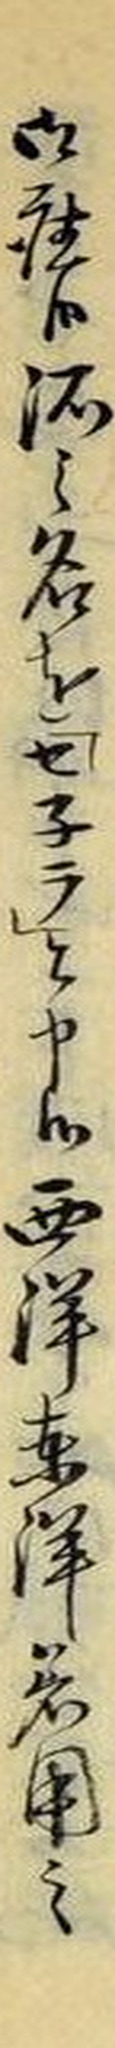御座候所之名を「セネラ」と申候西洋東洋着用之
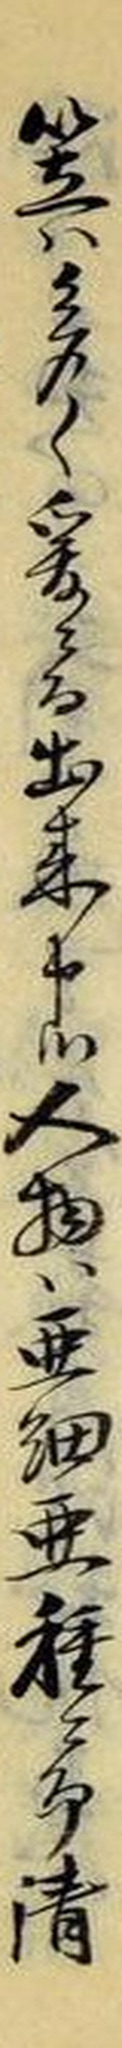笠ハ多く爰ニ而出来申候人物ハアジア種ニ而清
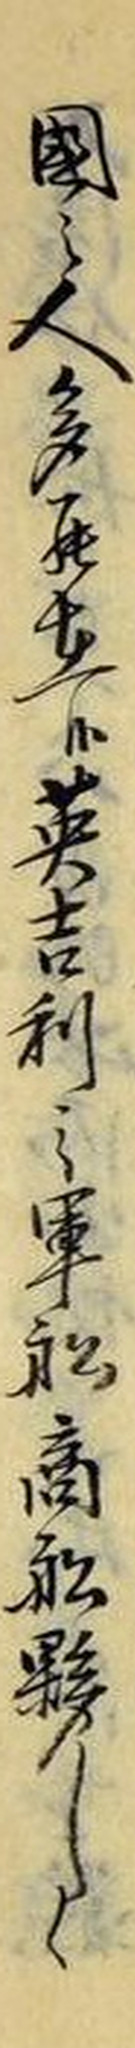国之人多罷在候イギリス之軍船商船夥しく

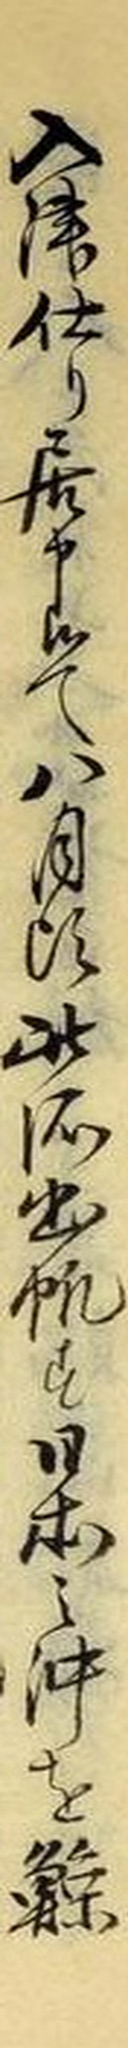入津仕り居申候て八月頃此所出帆す日本之沖を鯨
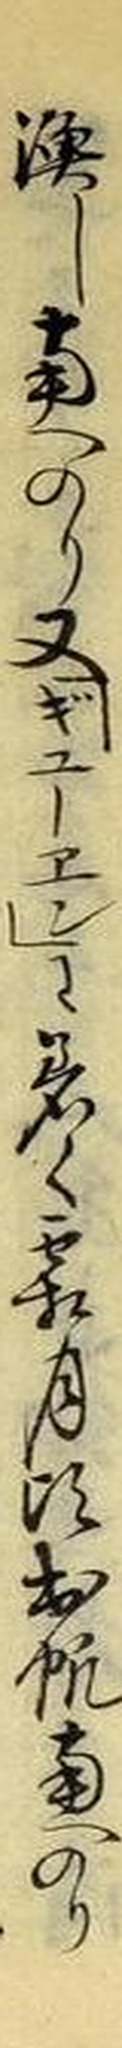漁し南へのり又「ギユーエン」に着く霜月頃出帆南へのり
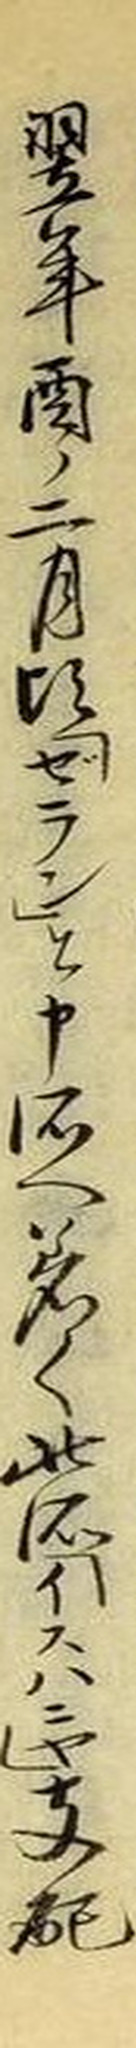翌年酉ノ二月頃「ゼラン」と申所へ着く此所「イスハニヤ」支配
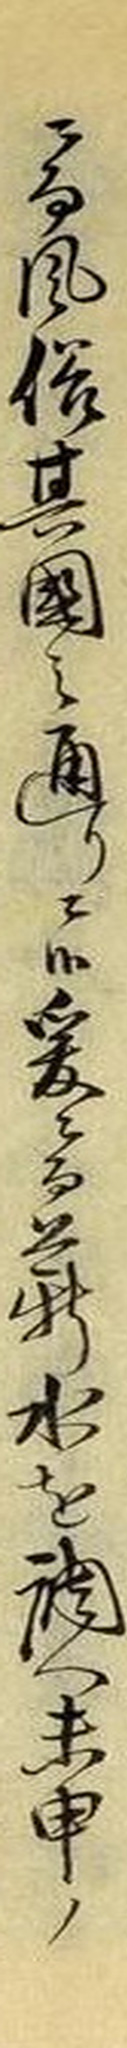ニ而風俗其国之通りニ候爰ニ而薪水を調へ未申ノ
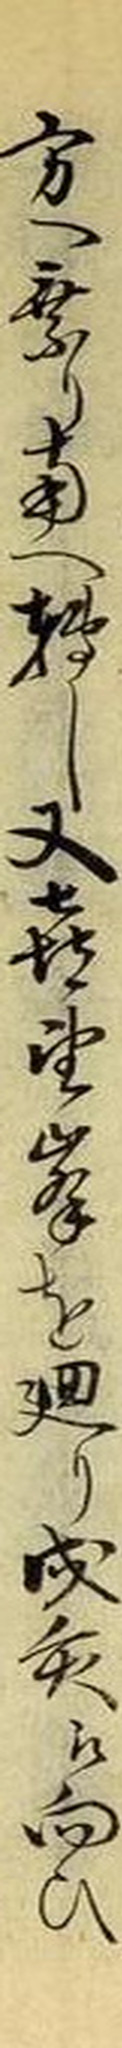方へ乗り南へ転し又喜望峰を廻り戌亥江向ひ
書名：漂客談奇（備考雑録写8）
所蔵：福井県文書館 Fukui Prefectural Archives
